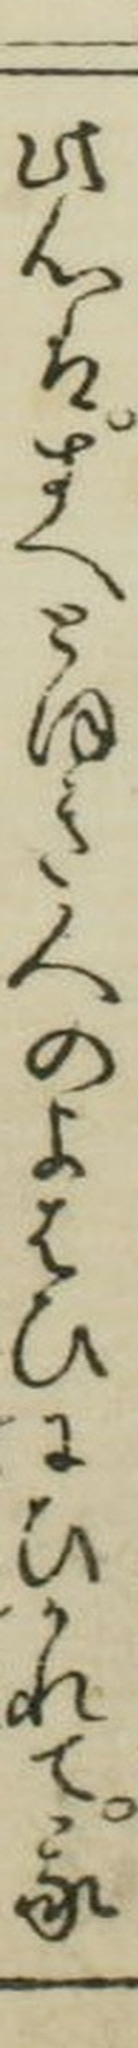此心は。すへとほき人のよはひにひかれて。我
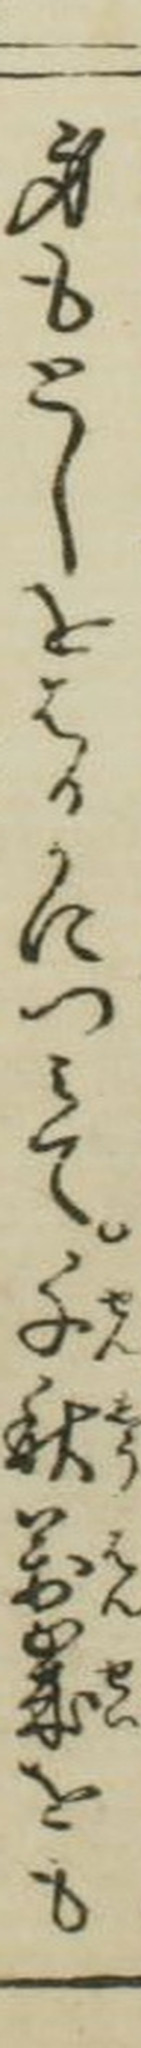身もとしをはるかにつみて。千秋万歳をも
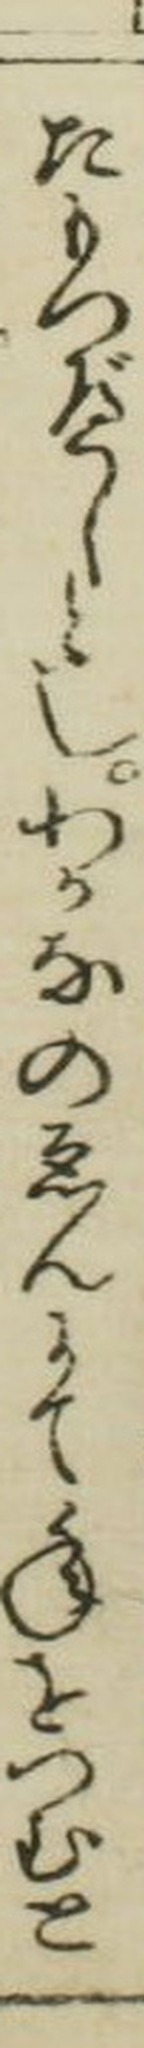たもつべしと也。わかなのゑんにて年をつむと
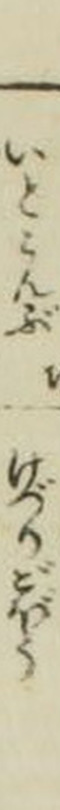いとこんぶけづりごぼう
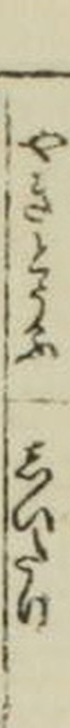やきとうふしいたけ
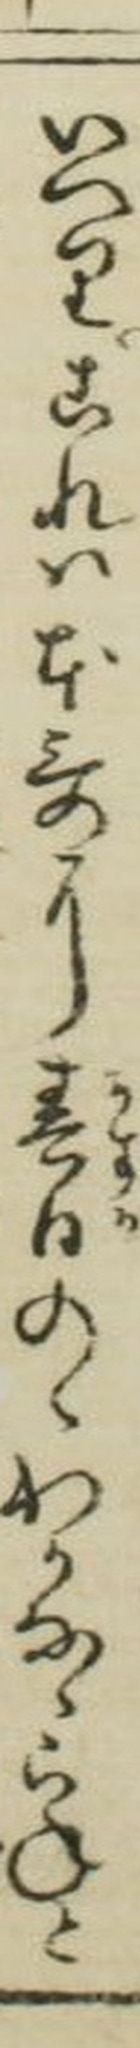いへり。これは本哥に春日のゝわかなゝらねと
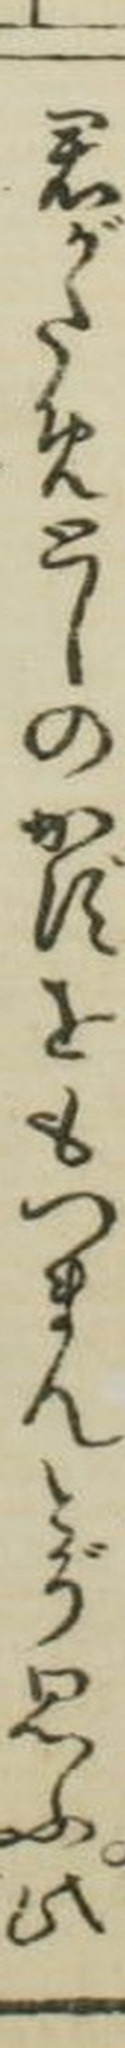君がためとしのかずをもつまんとぞ思ふ。此
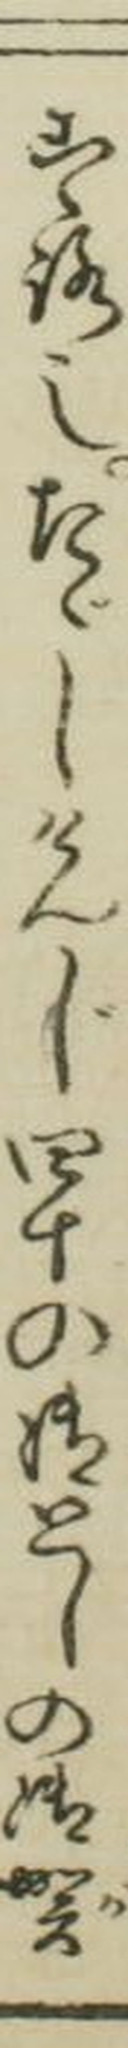こゝろ也。たゞしけんじ四十の御としの御賀
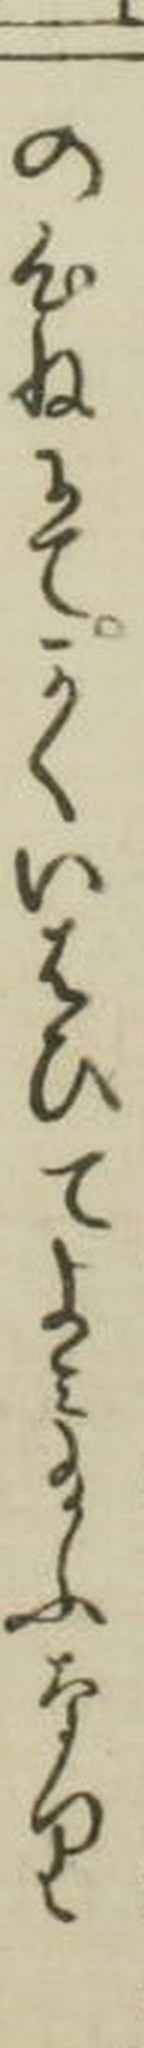の心ねにて。かくいはひてよみ給ふなり
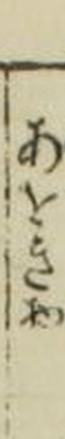あをき物
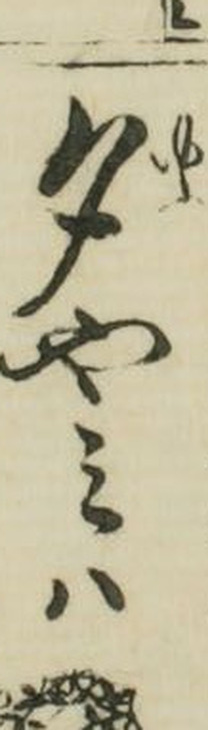夕やみは
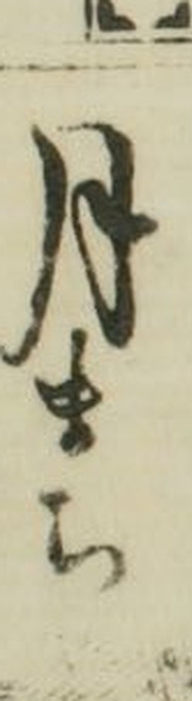月まち
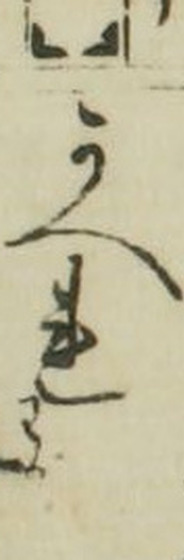かへれ
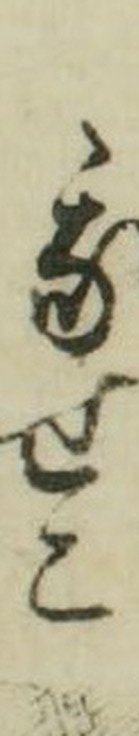我せこ
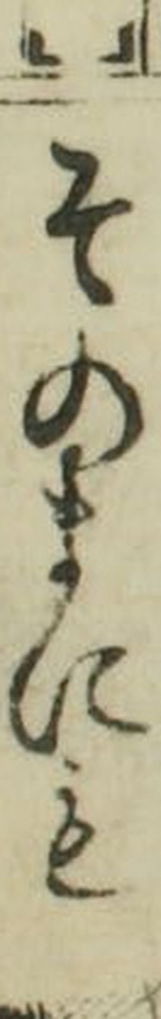そのまにも

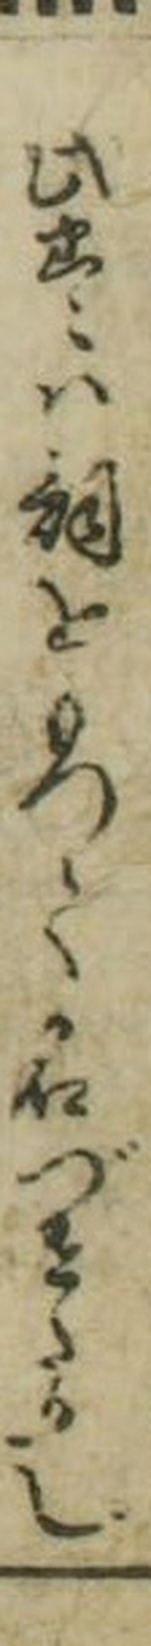此巻は詞をもつて名づけたる也
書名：女源氏教訓鑑
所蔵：東京学芸大学附属図書館
